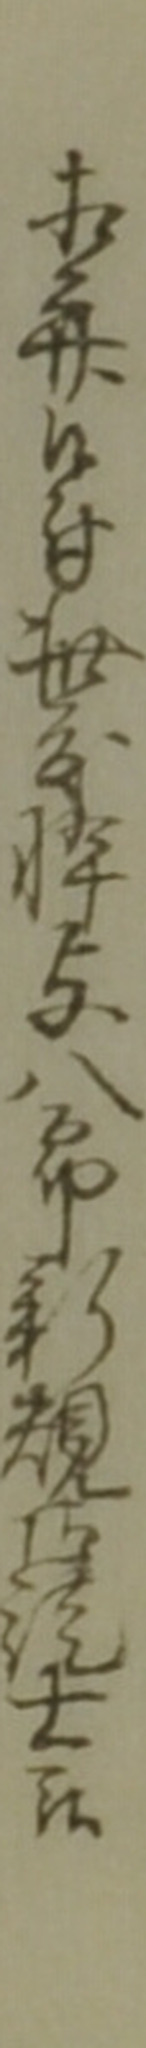相弁候付此度忰与八郎新規御徒士被
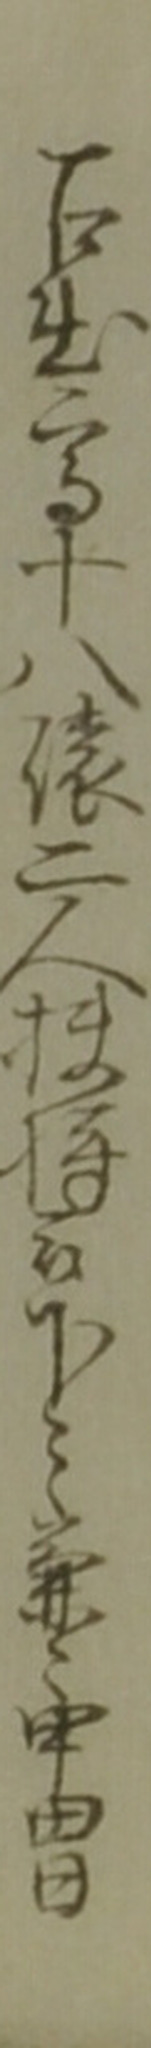召出高十八俵二人扶持被下之兼々甲冑
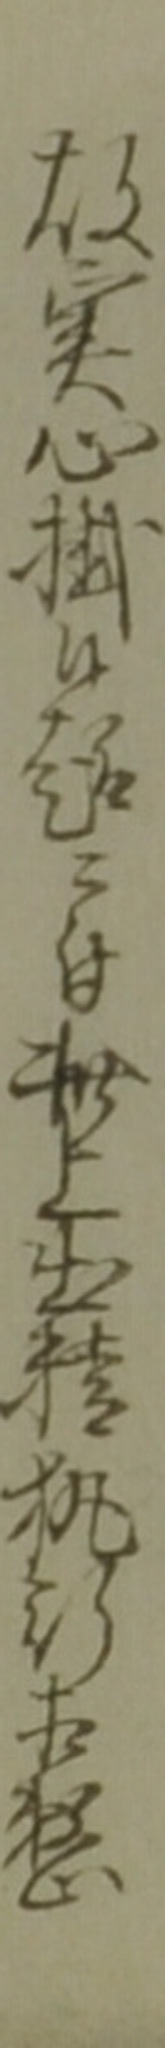故実心掛候趣ニ付此上出精執行相整
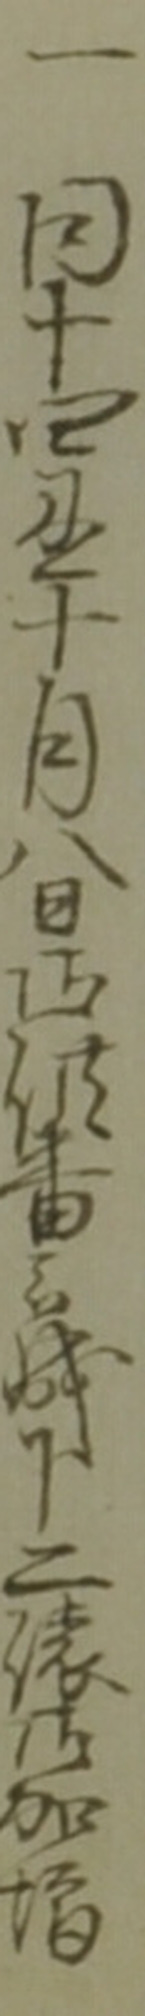一同十四丑十月八日御供番被成下二俵御加増
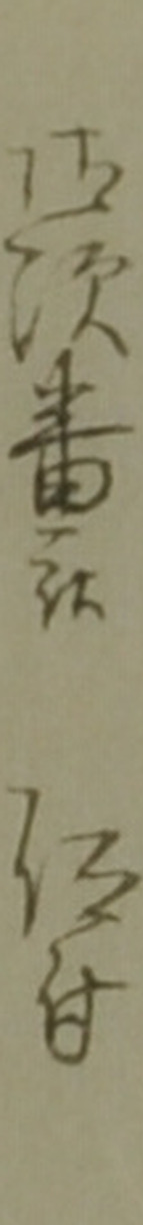御次番被仰付
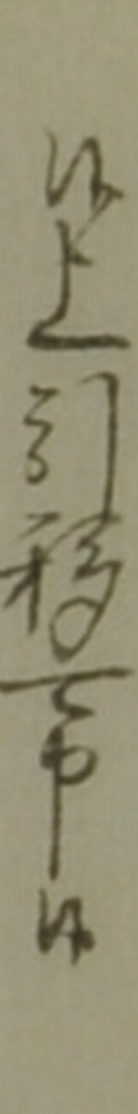候上引移可申候
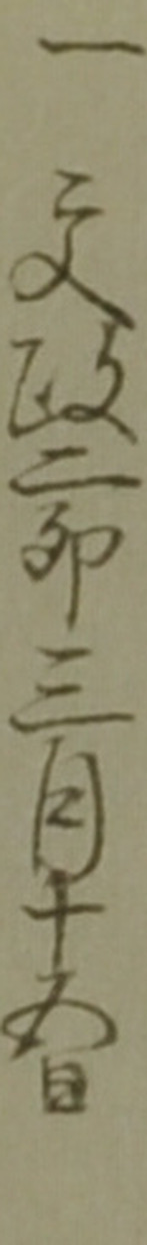一文政二卯三月十五日
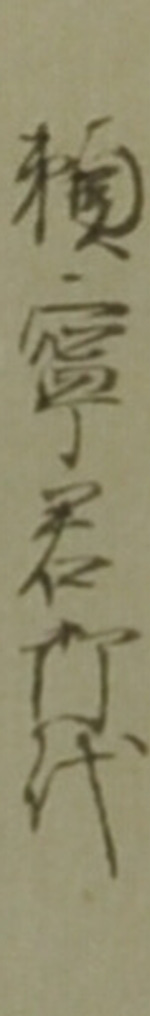頼寧君御代
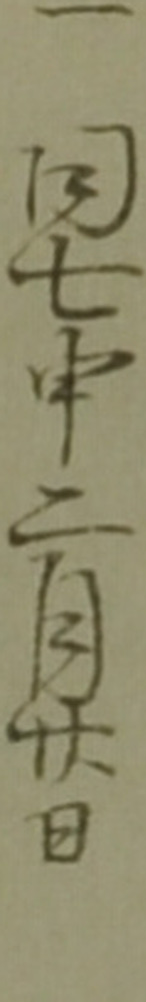一同七申ニ月廿日
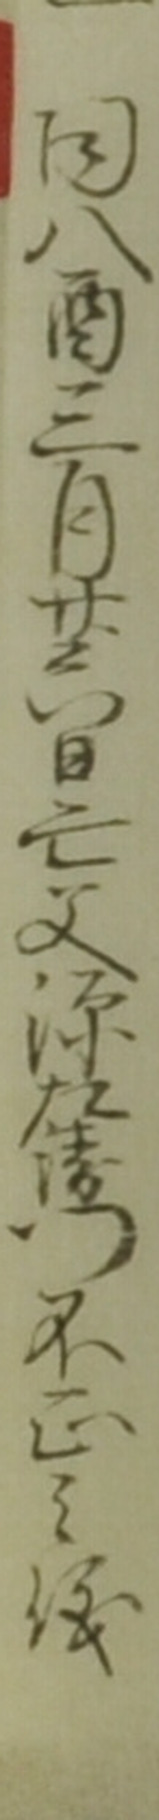一同八酉三月廿六日亡父源左衛門不正之儀

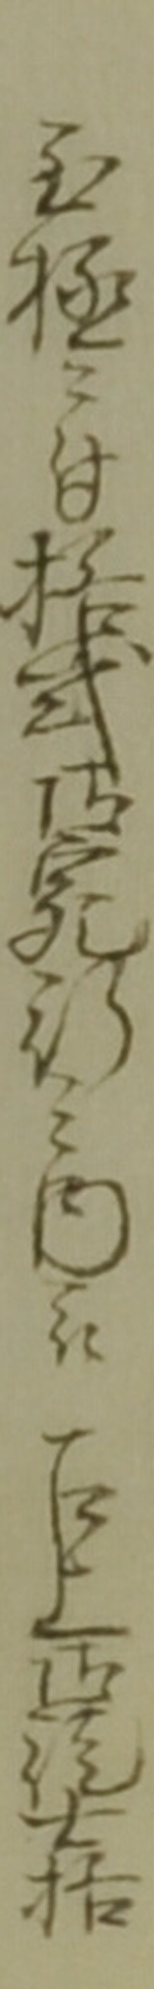至極ニ付格式御宛行之内被召上御徒士格
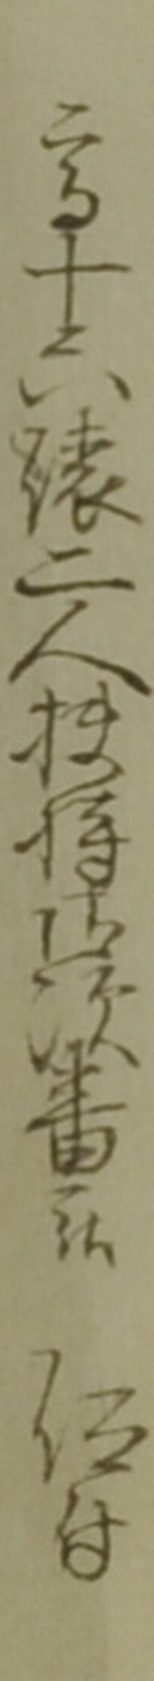高十六俵二人扶持御次番被仰付
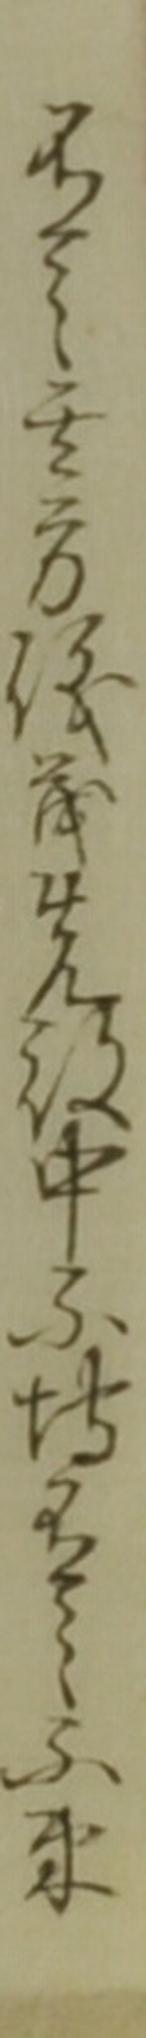有之其方儀茂先役中不埒有之不束
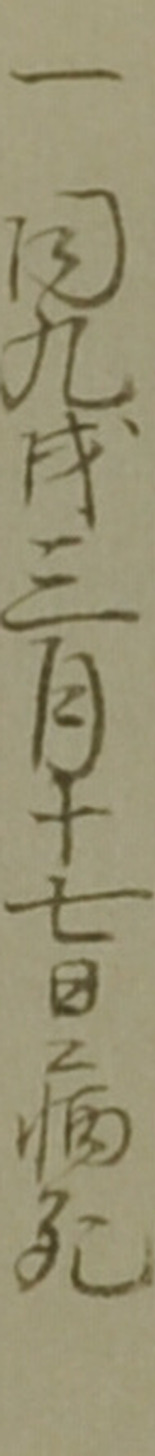一同九戌三月十七日病死
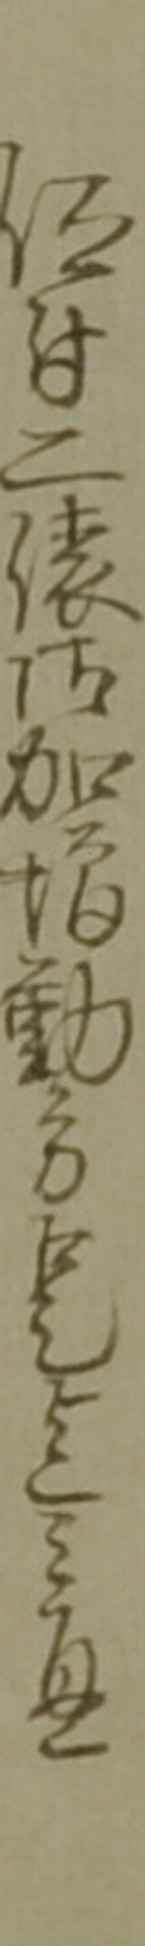仰付二俵御加増勤方是迄之通
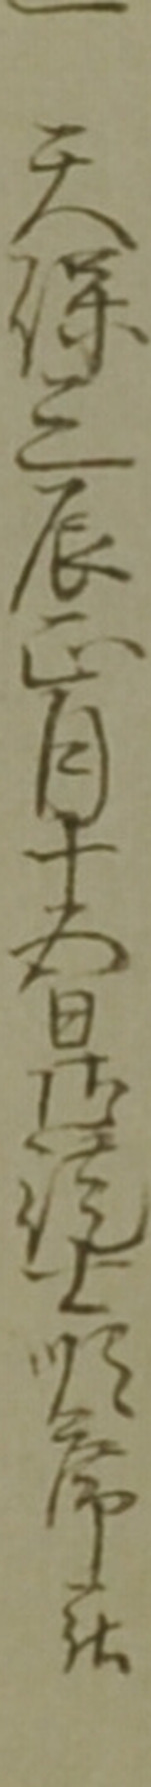一天保三辰正月十五日御徒士順席被
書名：無足諸士勤仕録（六）
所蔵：伊那市立高遠町図書館・合同会社AMANE
